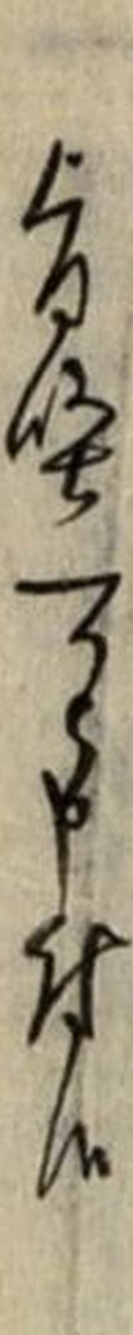旨堅可被申付候
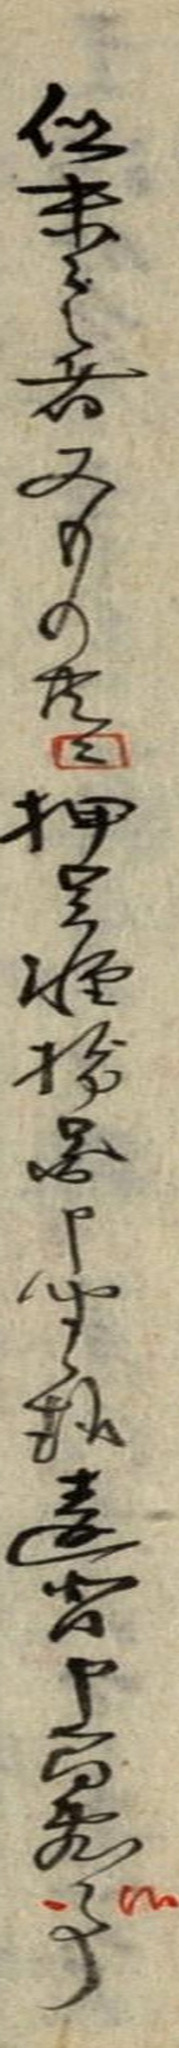但末々之者又もの共押足軽指図申聞候趣違背申間敷候
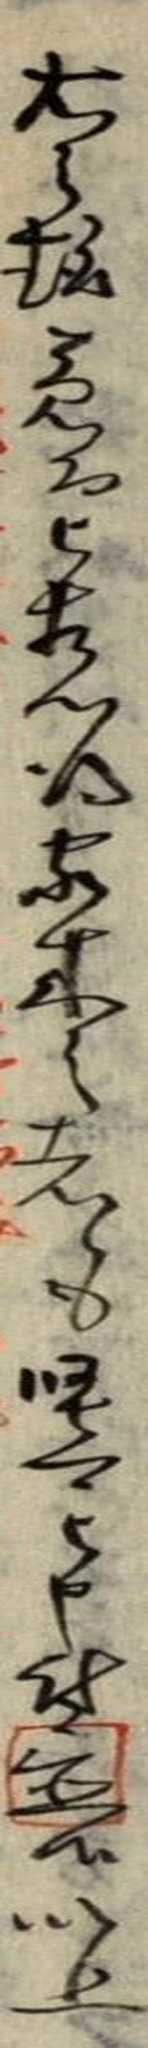右之趣兼て被相心得家来之者へも堅可被申付候以上
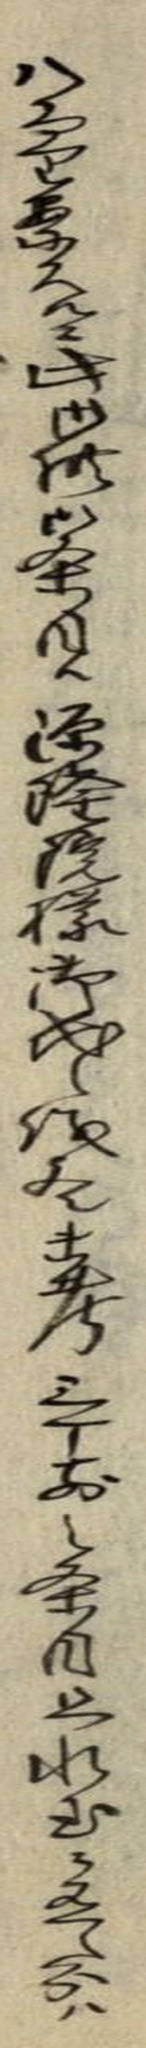八百里案するに此御供御条目は源隆院様御代之儀歟未考三丁前之条目且水玉に有之分は
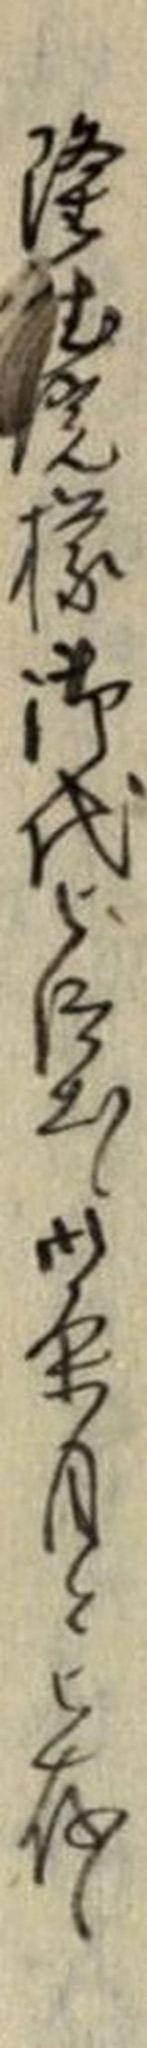隆徳院様御代被仰出候御条目と被存候
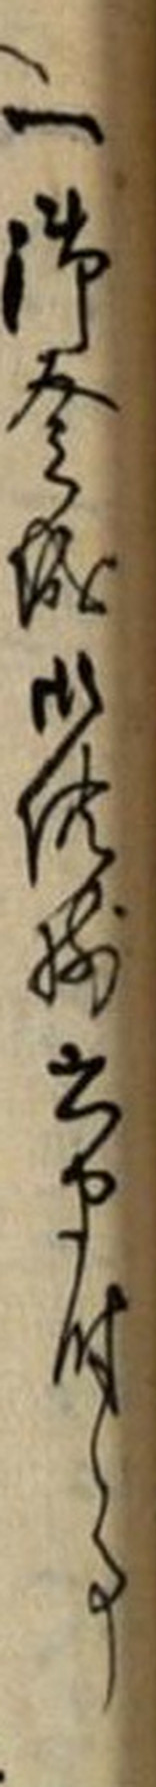一御登城御供揃六半時之事
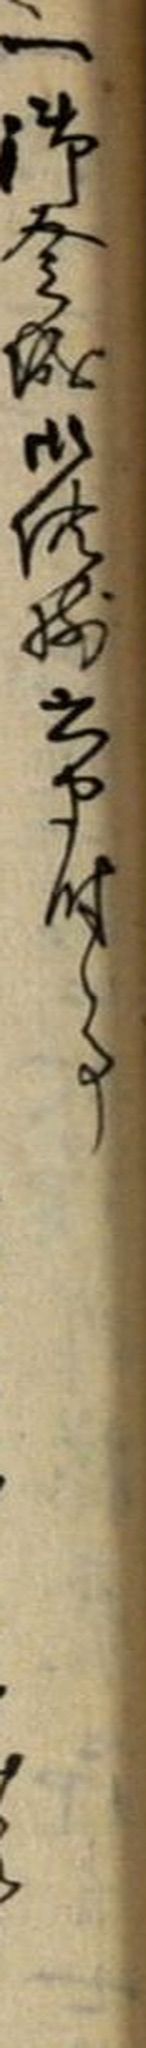一御登城御供揃六半時之事
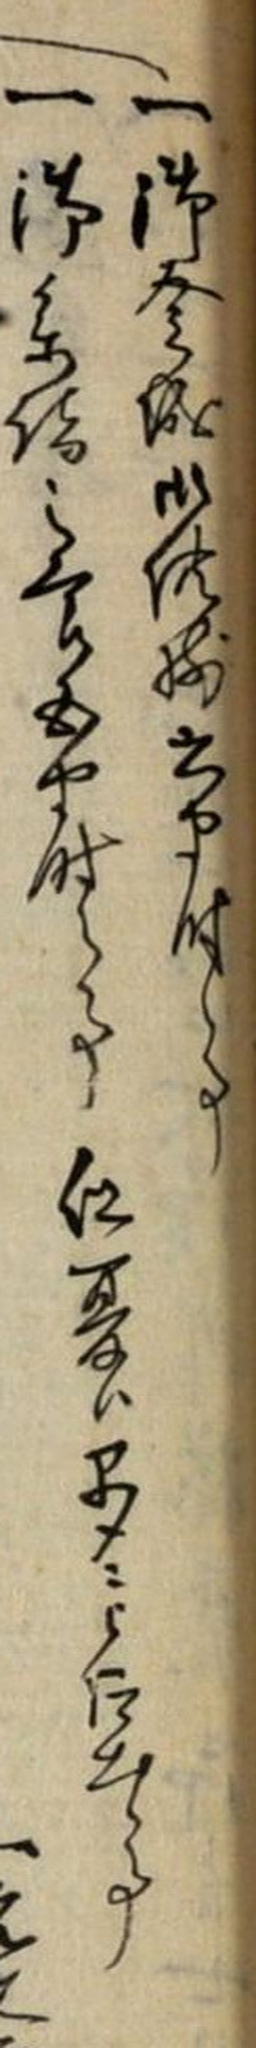一御参詣之節五半時之事但夏は早めに被仰出候事
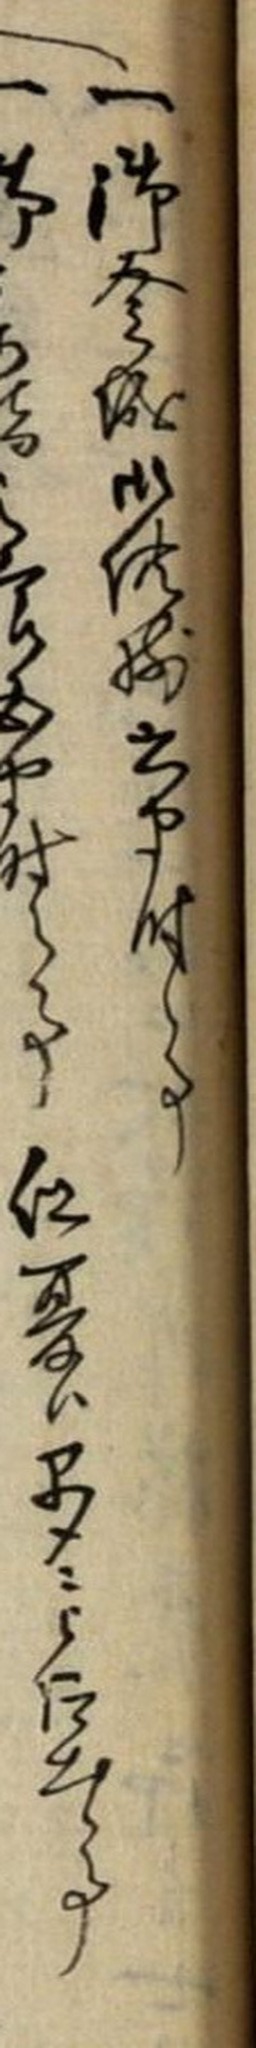一御参詣之節五半時之事但夏は早めに被仰出候事
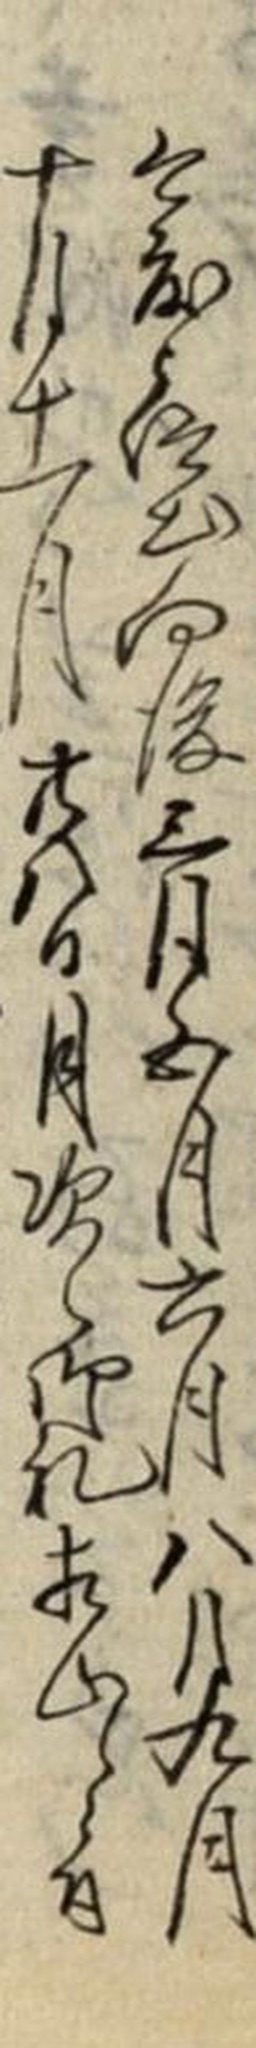右水玉十月十一月廿八日月次之御礼相止候に付
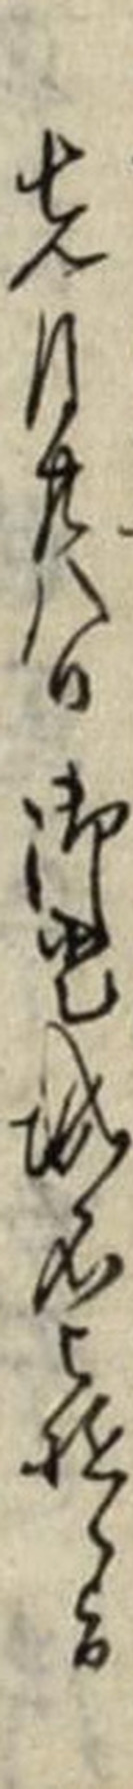先月廿八日御登城不被遊候旨
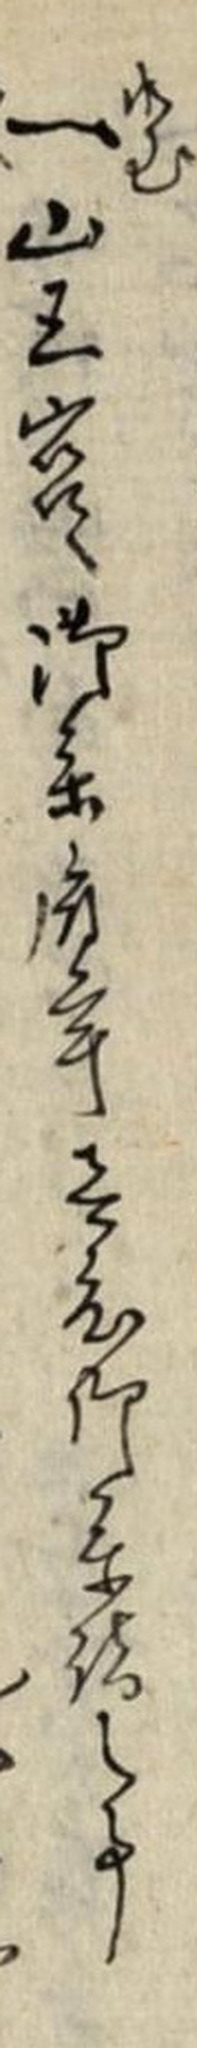一山王宮へ御参府年壱度御参詣之事
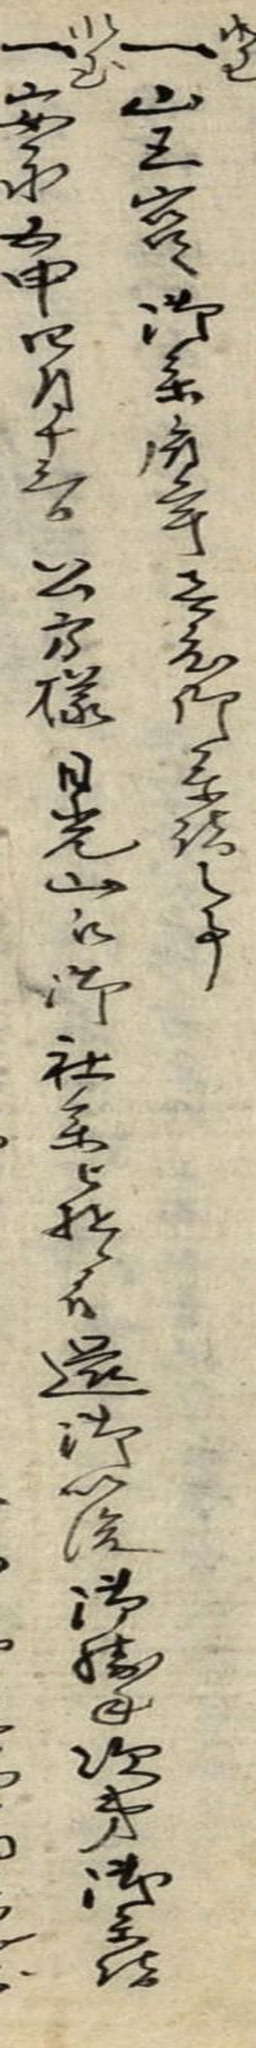一安永五申四月十三日公方様日光山江御社参被遊候に付還御以後御勝手次第御参詣
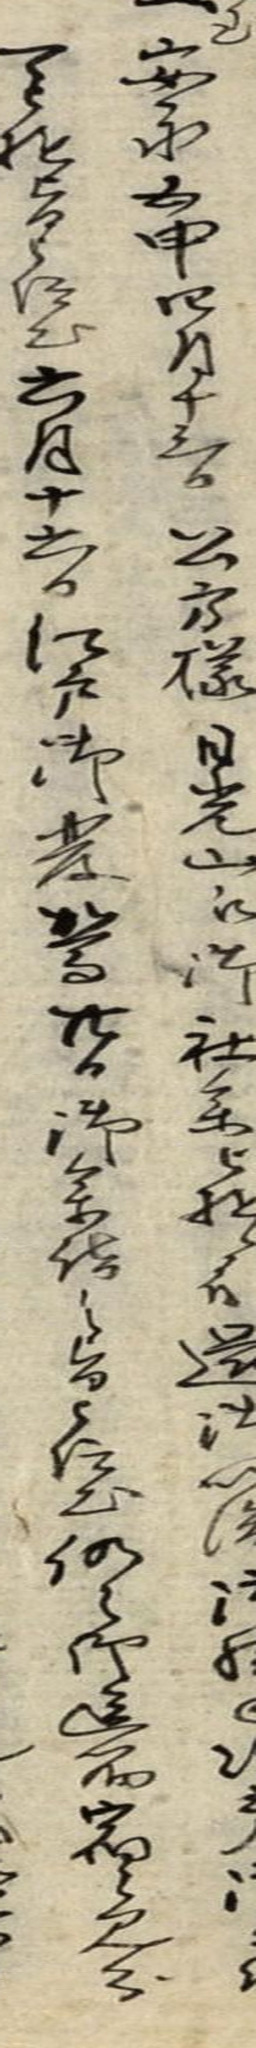可被遊旨被仰出六月十六日江戸御発駕廿日御参詣之旨被仰出仍之御道筋宿々見分
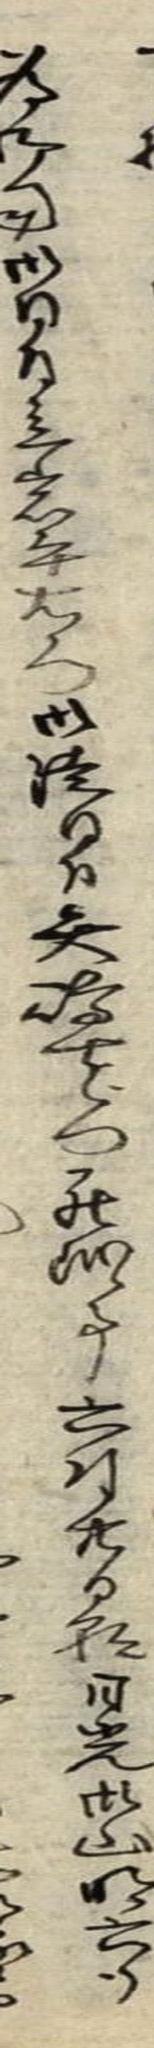為御用御日付立岩平右衛門御徒目付矢嶋十右衛門罷越候事六月廿日朝日光御山明六ツ
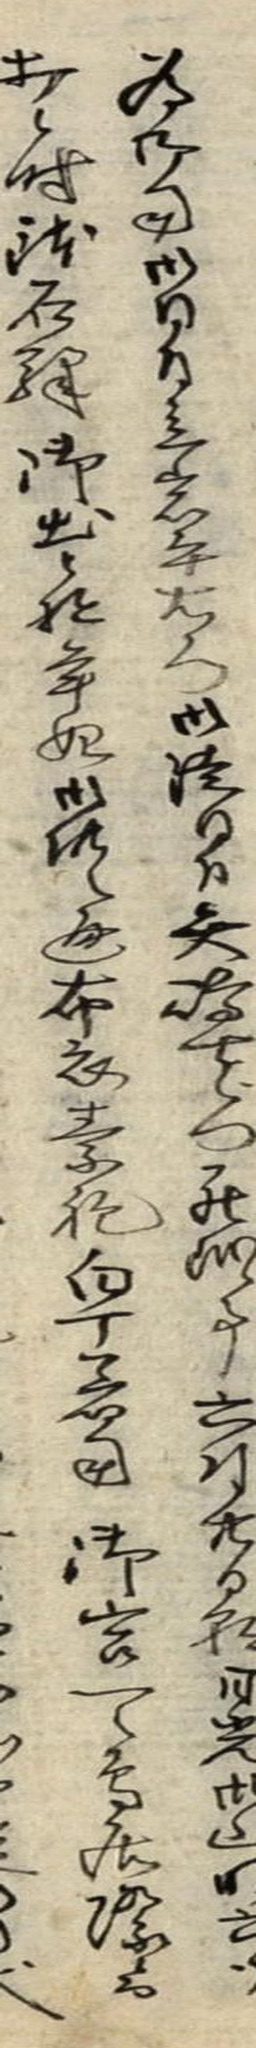打候時鉢石駅御出被遊年始御供之通布衣素袍白丁着用御宮一之鳥居際にて
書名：三都并道中之部
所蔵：福井県文書館 Fukui Prefectural Archives
